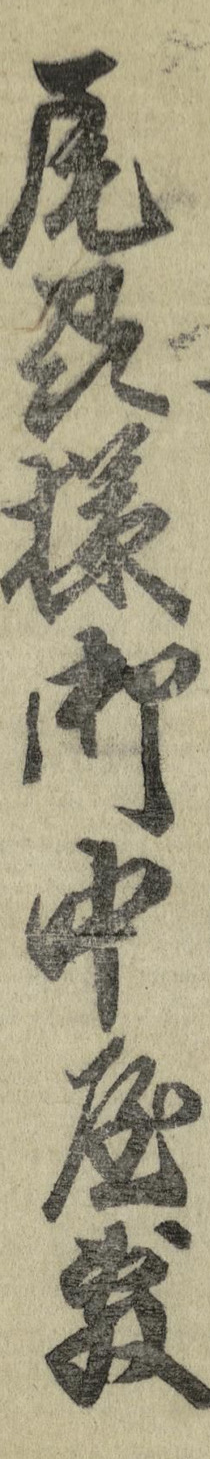尾州様御中屋敷
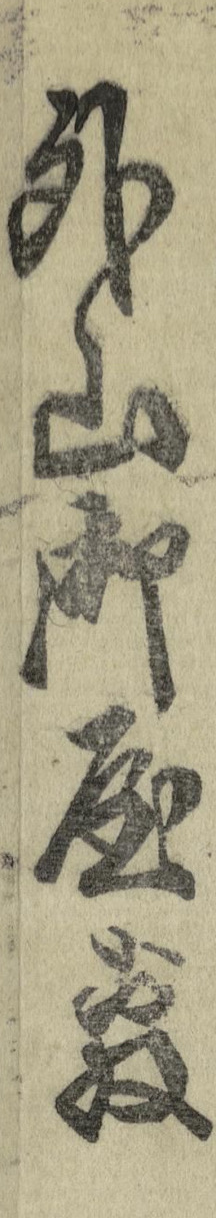外山御屋敷
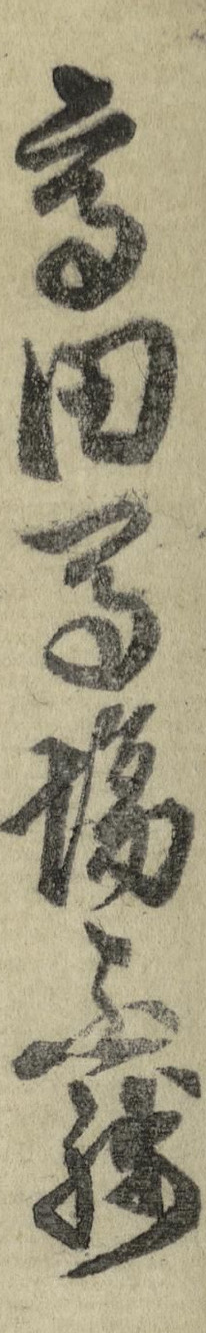高田馬場不残
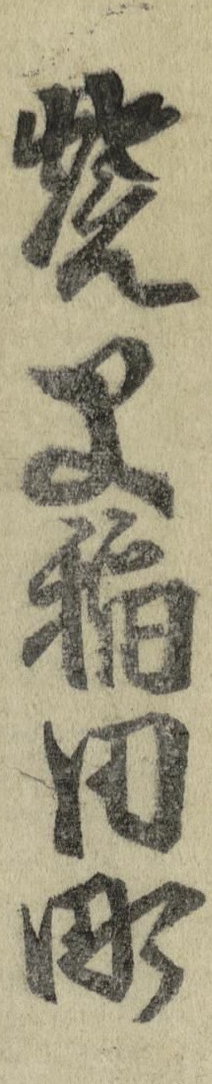焼る稲田町
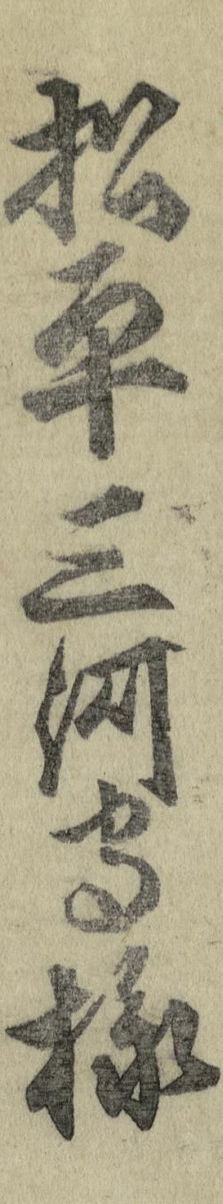松平三河守様
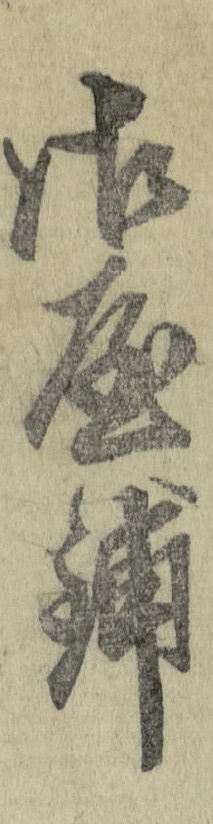御屋鋪
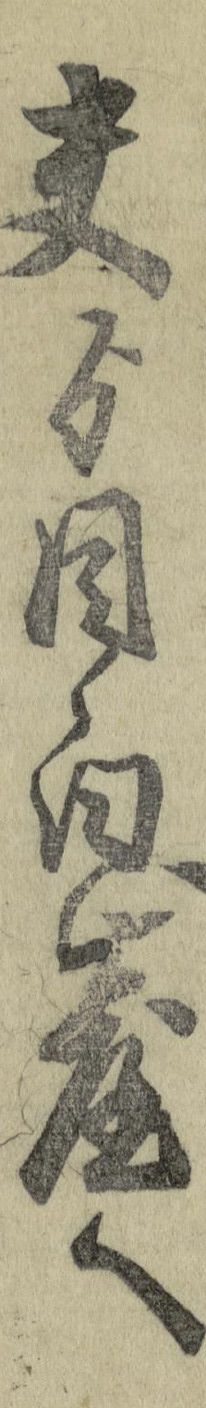夫ゟ目白台へ
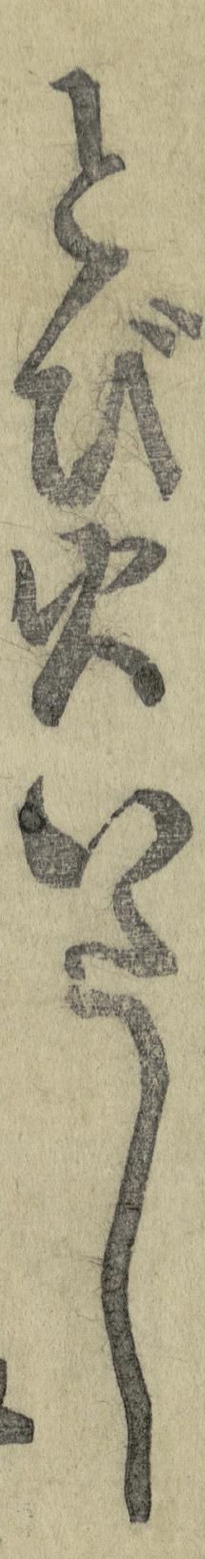とび火いたし
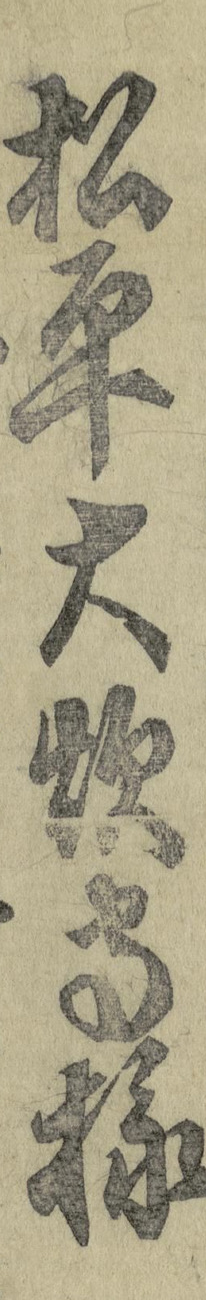松平大炊守様
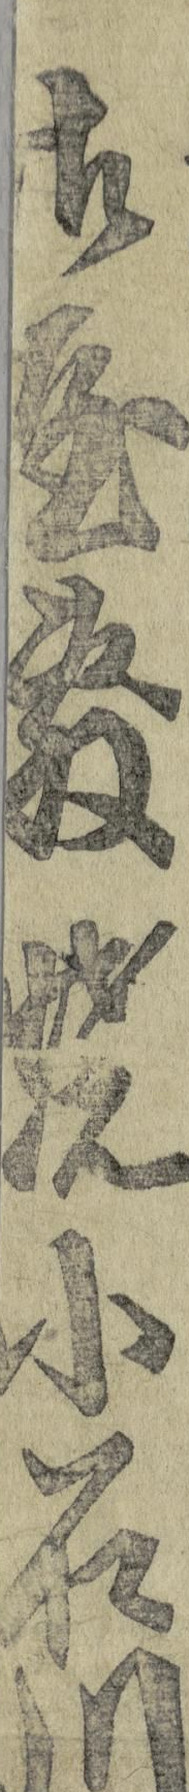御屋敷焼小石川
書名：江戸大火本しらべ
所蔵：東京大学地震研究所図書室 Earthquake Research Institute Library, The University of Tokyo, JAPAN
